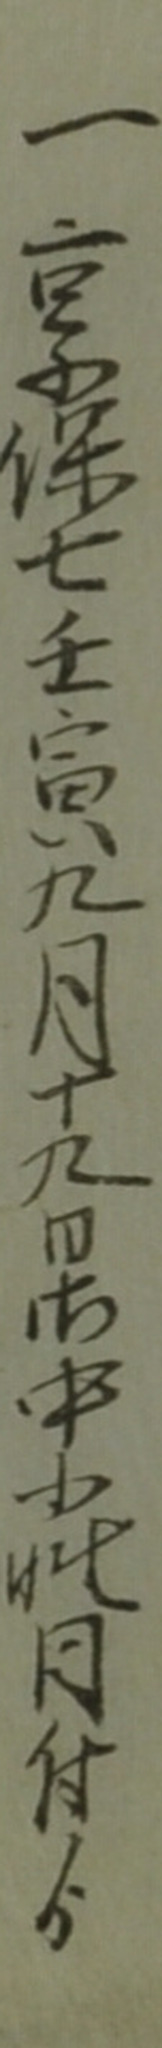一享保七壬寅九月十九日御中小姓目付より
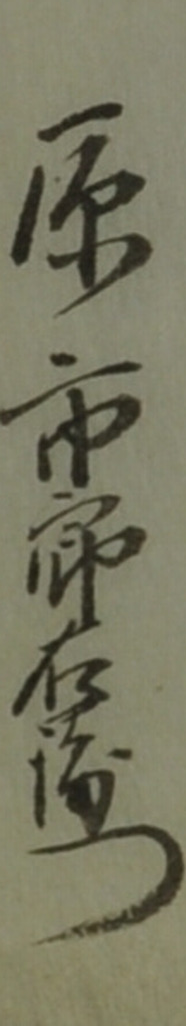原市郎右衛門
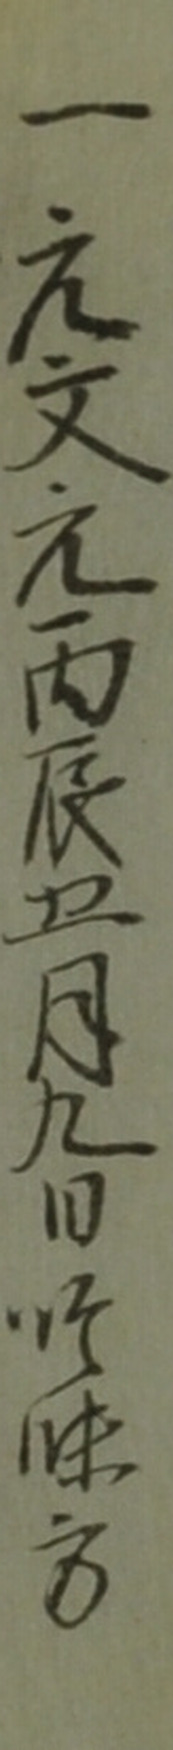一元文元丙辰五月九日吟味方
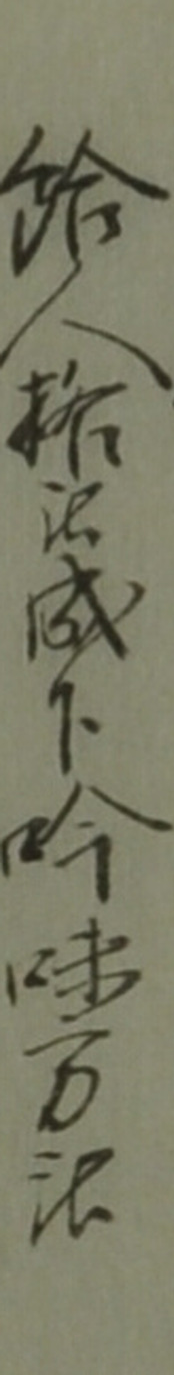給人格被成下吟味方被
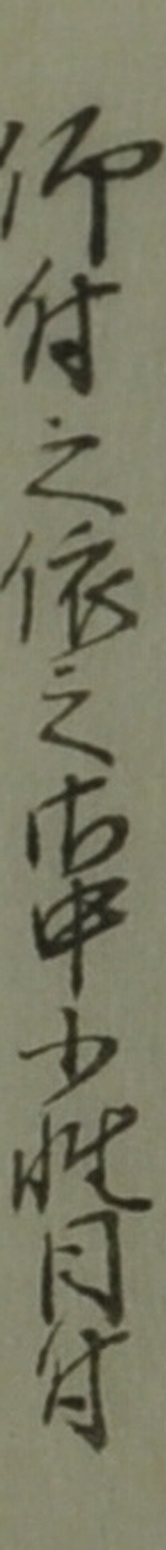仰付之依之御中小姓目付
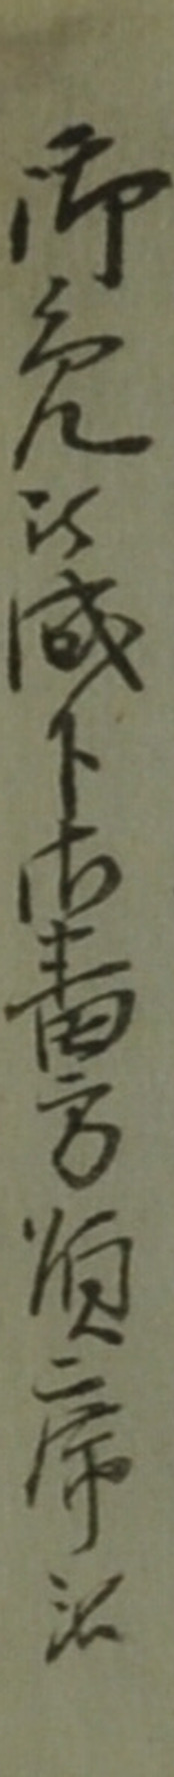御免被成下御番方順席被
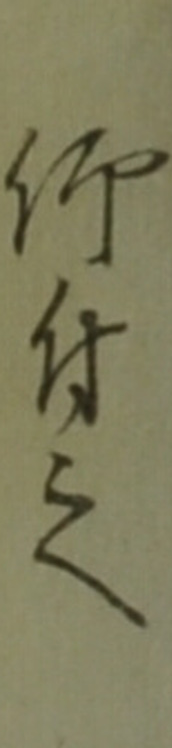仰付之

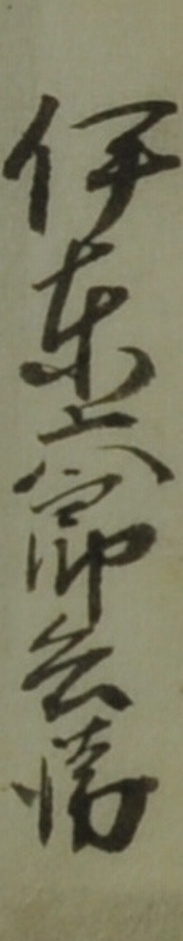伊東六郎兵衛
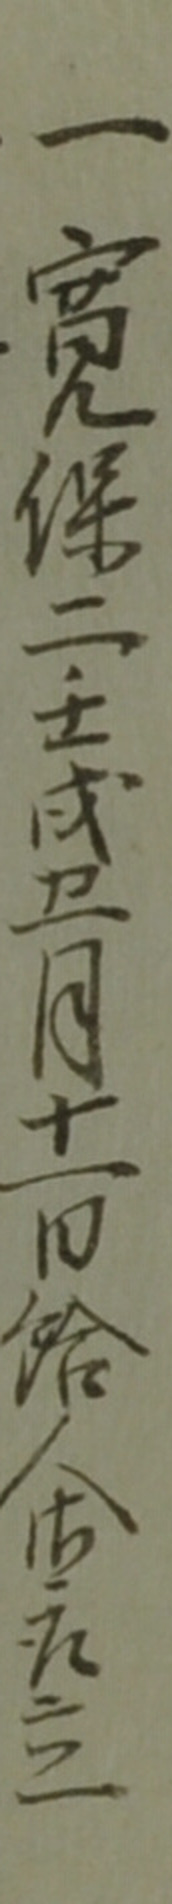一寛保二壬戌五月十一日給人御取立
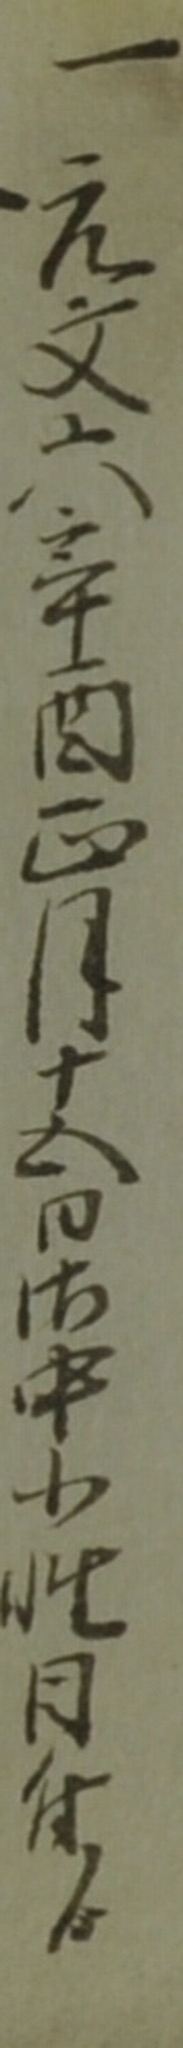一元文六辛酉正月十五日御中小姓目付より
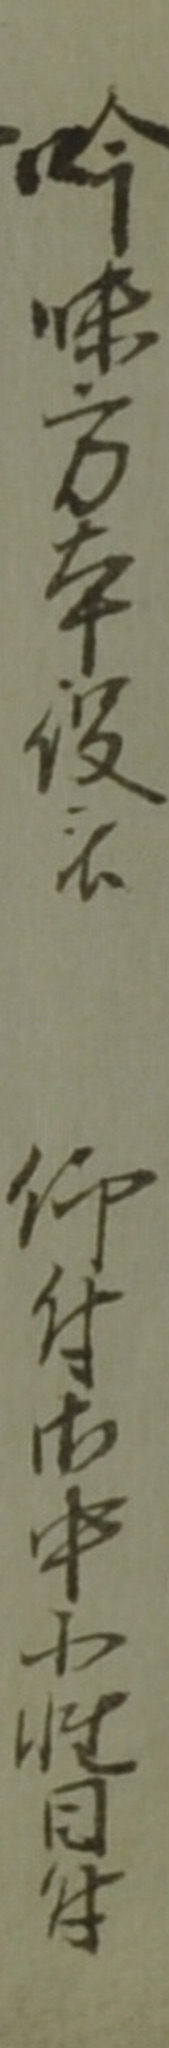吟味方本役被仰付御中小姓目付
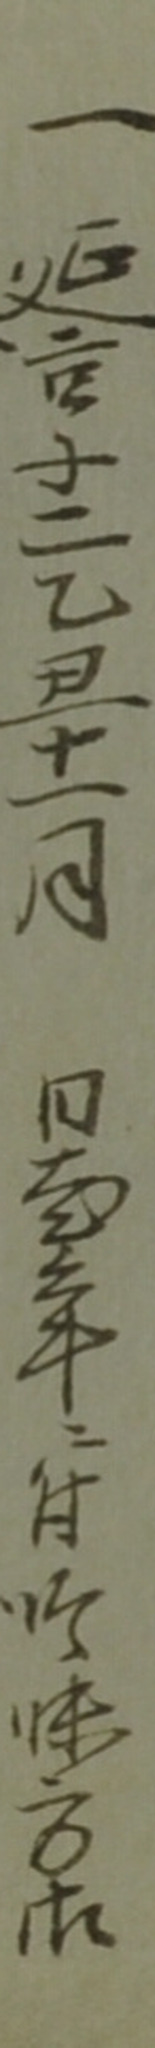一延享二乙丑十一月日老年ニ付吟味方御
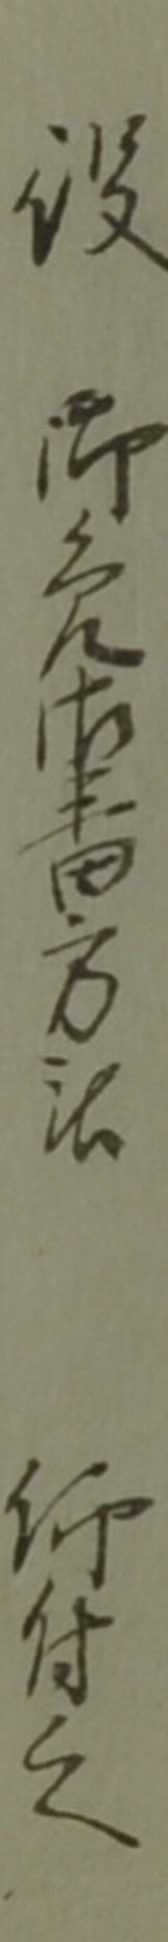役御免御番方被仰付之
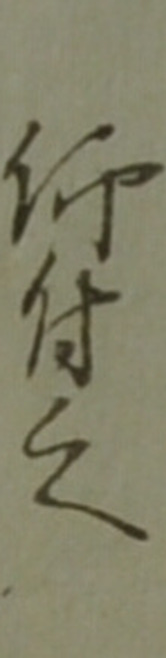仰付之
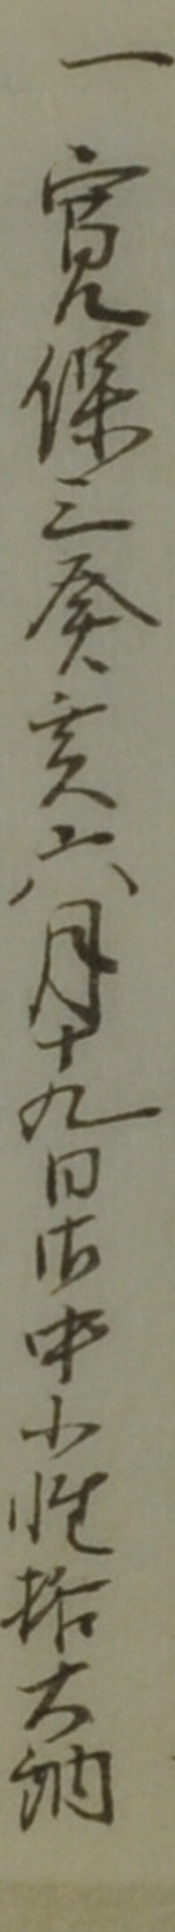一寛保三癸亥六月十九日御中小姓格大納
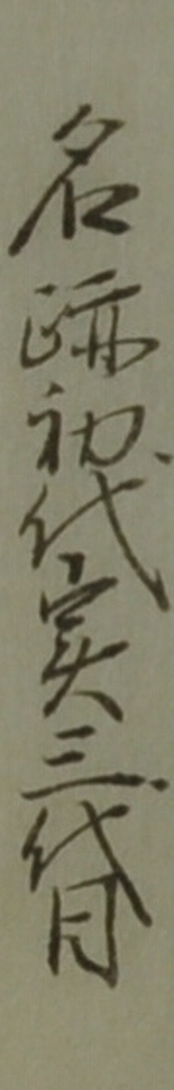名跡初代実三代目
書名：諸御役代々録（八）
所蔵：伊那市立高遠町図書館・合同会社AMANE
